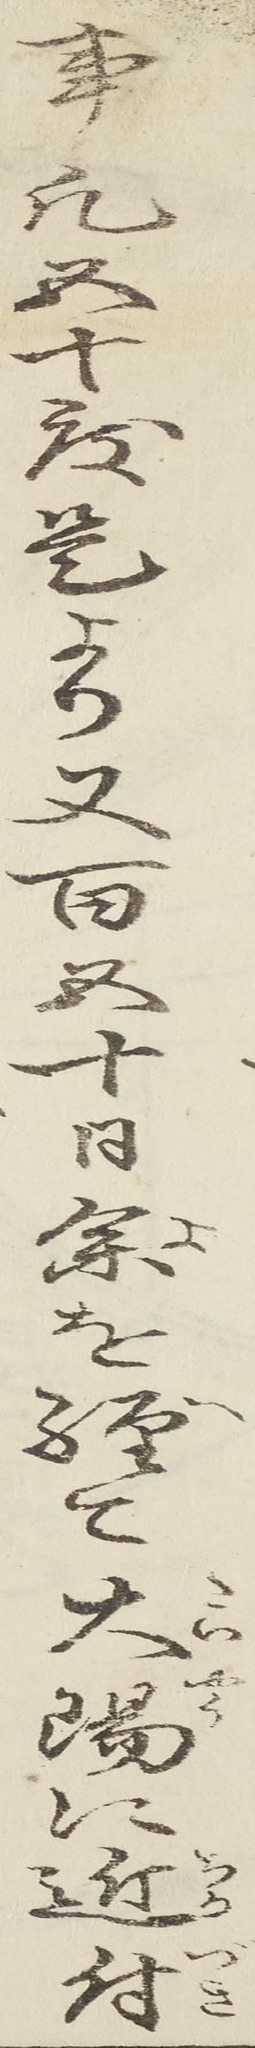事凡五十度是より又百五十日余を経て大陽に近付
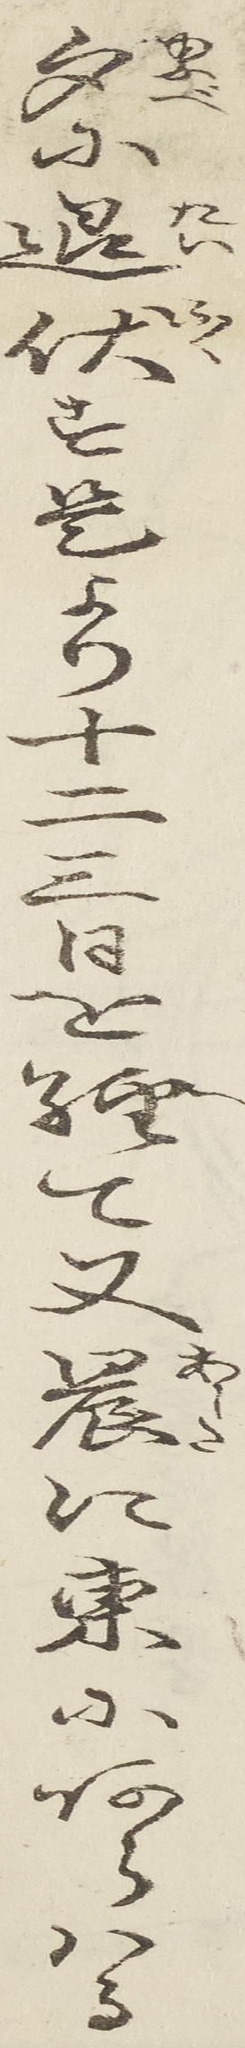夕に退伏す是より十二三日を経て又晨に東にあらはる
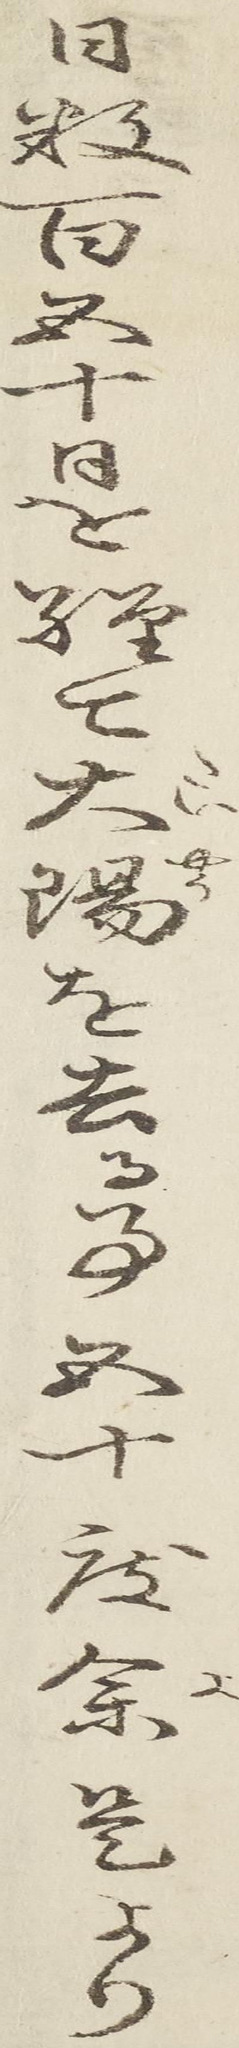日数百五十日を経て大陽を去る事五十度余是より
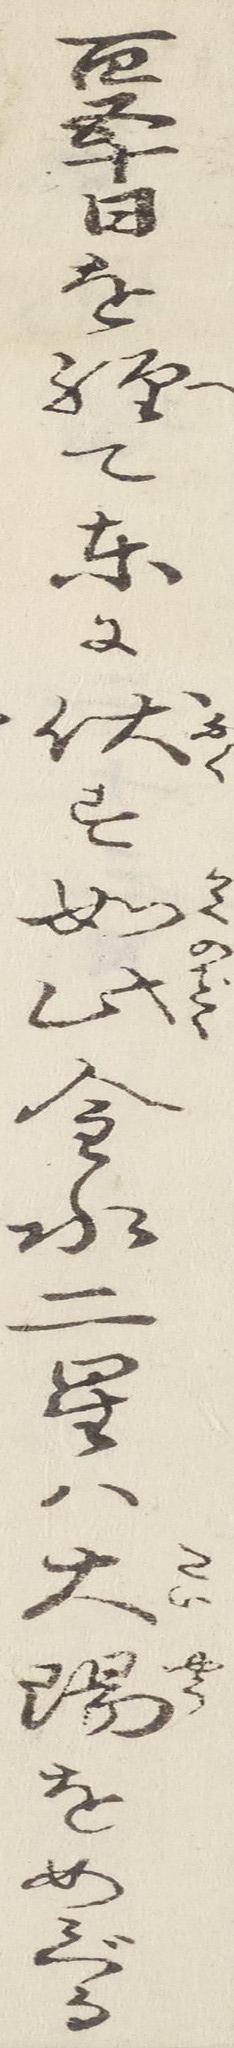百五十日を経て東に伏す如此金水二星は大陽をめぐる
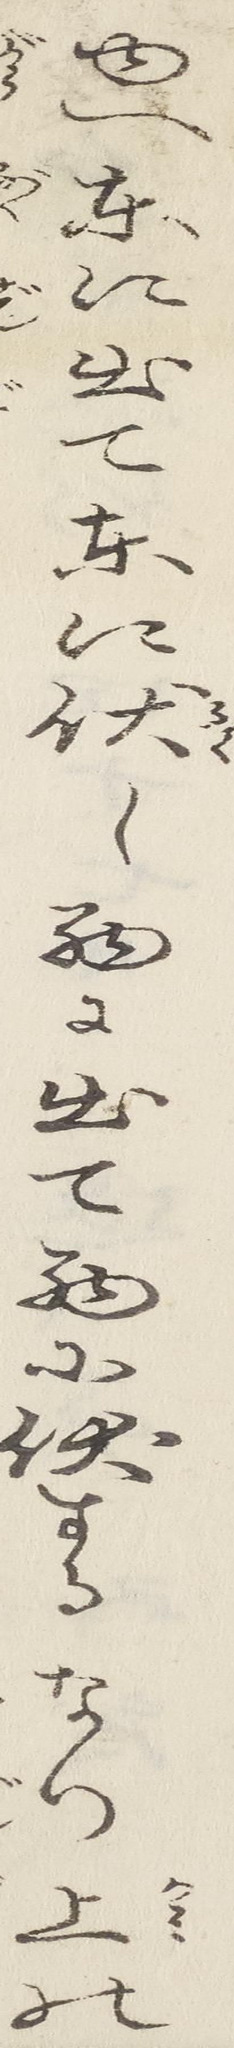ゆへ東に出て東に伏し西に出て西に伏するなり上の
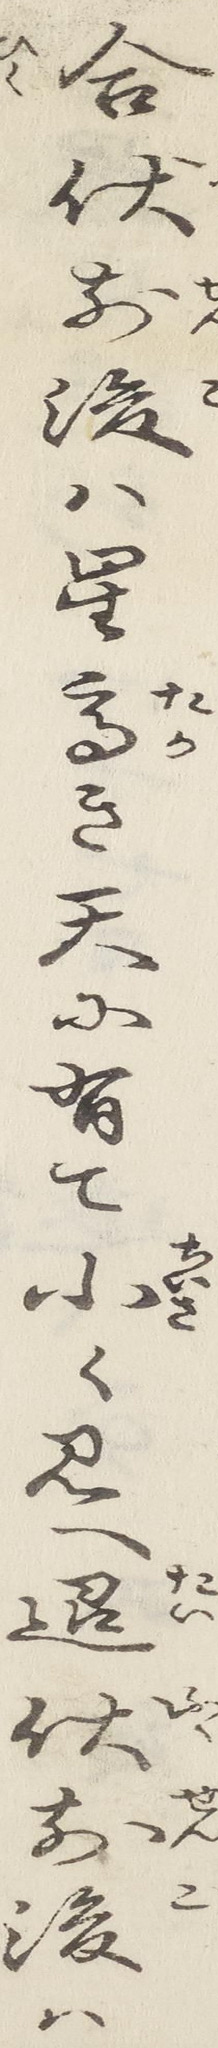合伏前後は星高き天に有て小く見へ退伏前後は
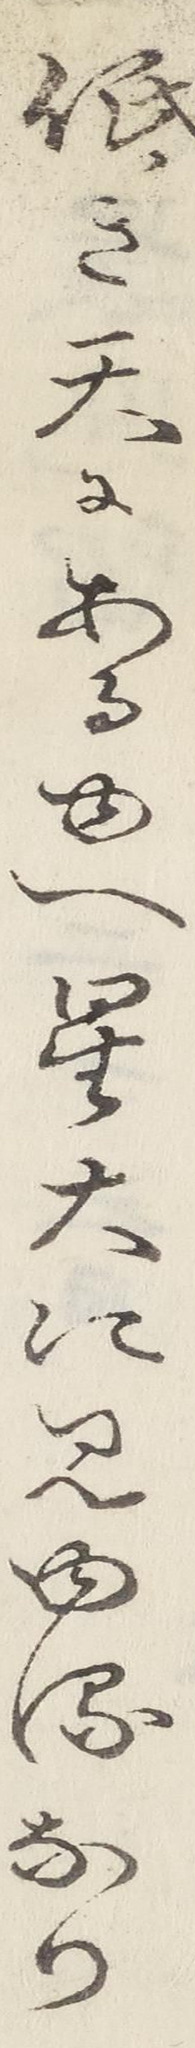低き天にあるゆへ星大に見ゆるなり
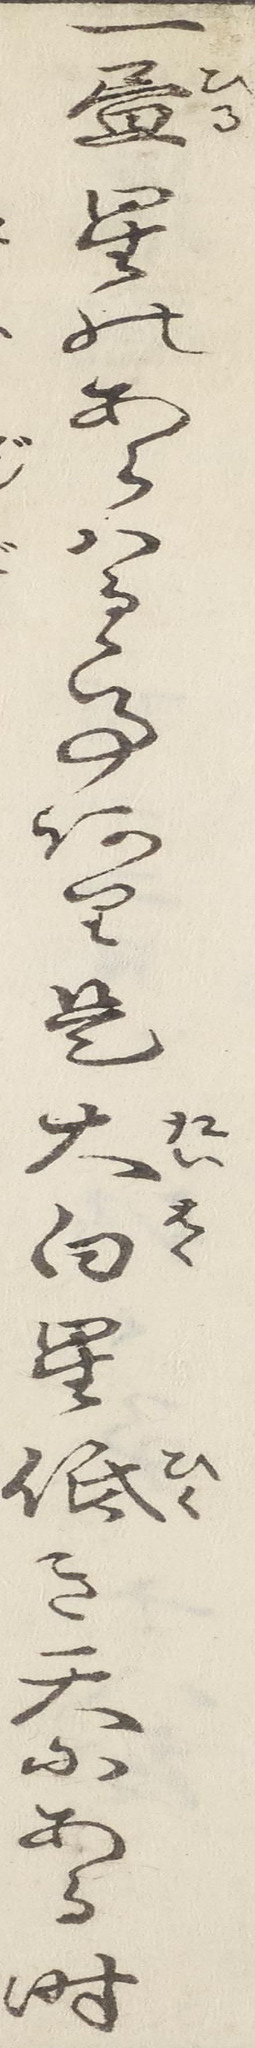一昼星のあらはるゝ事あり是大白星低き天にある時
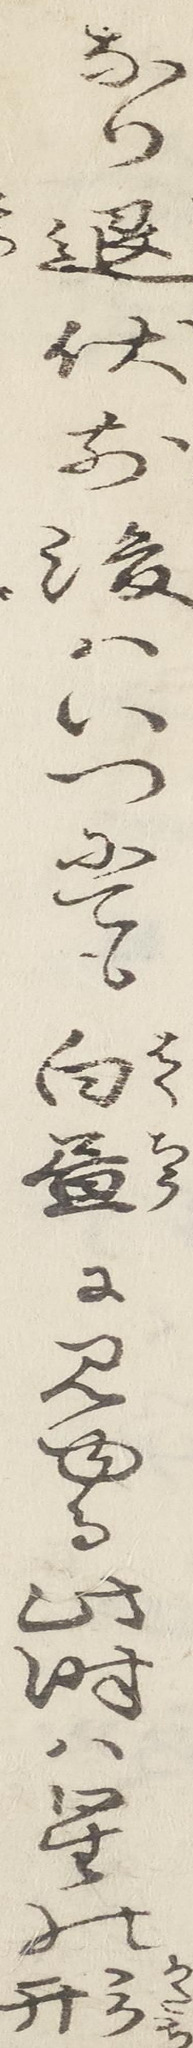なり退伏前後はいつにても白昼に見ゆる此時は星の形
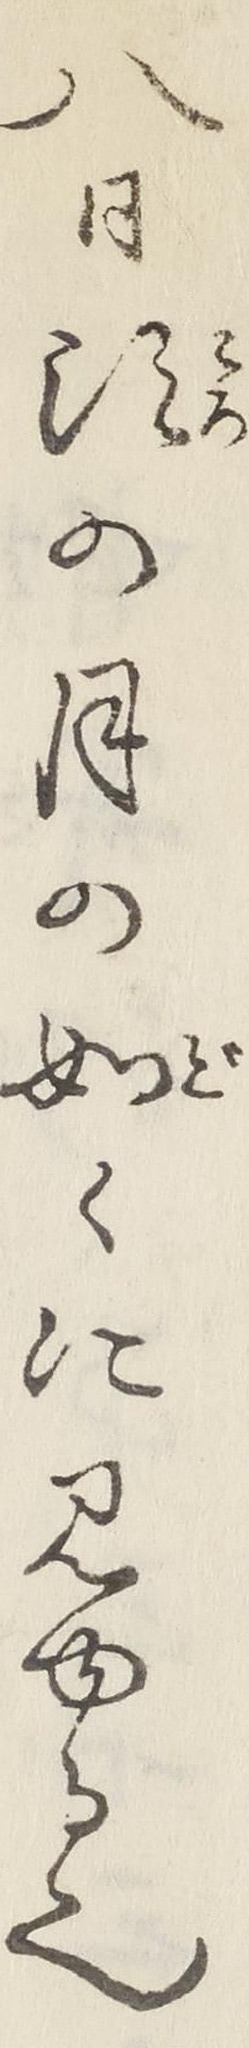八日頃の月の如くに見ゆる也
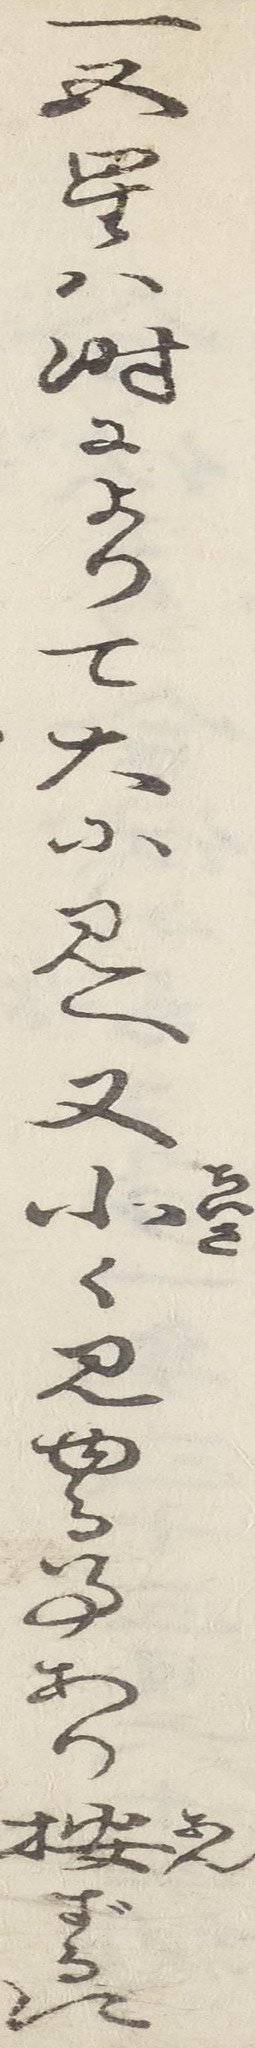一五星は時によりて大に見へ又小く見ゆる事あり按ずるに
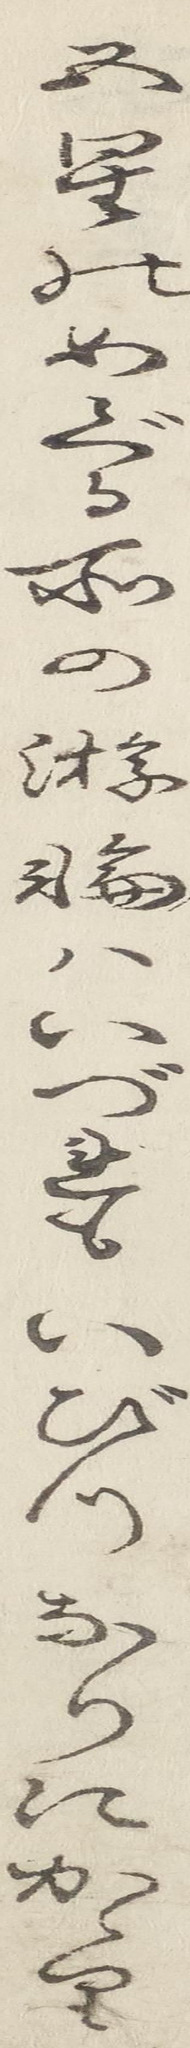五星のめぐる所の游輪はいづれもいびつなりにかゝり
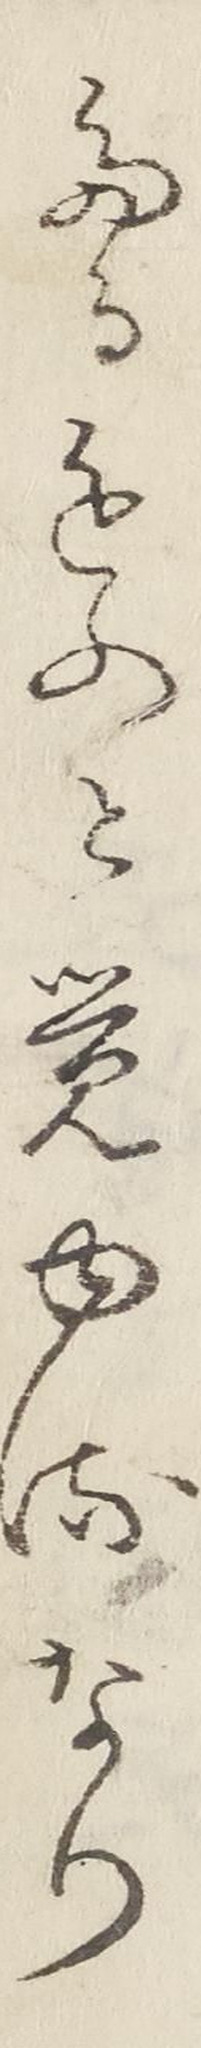たるものと覚ゆるなり

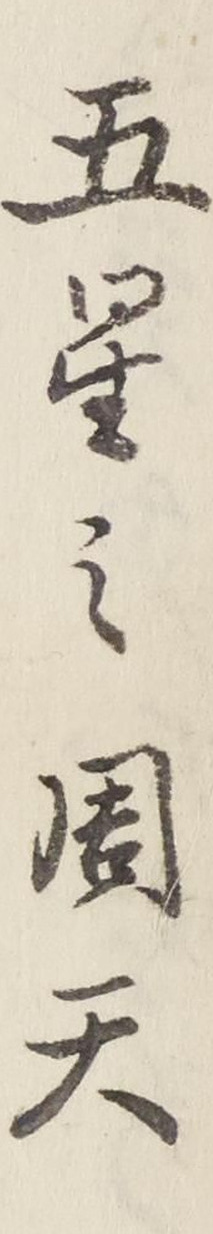五星の周天
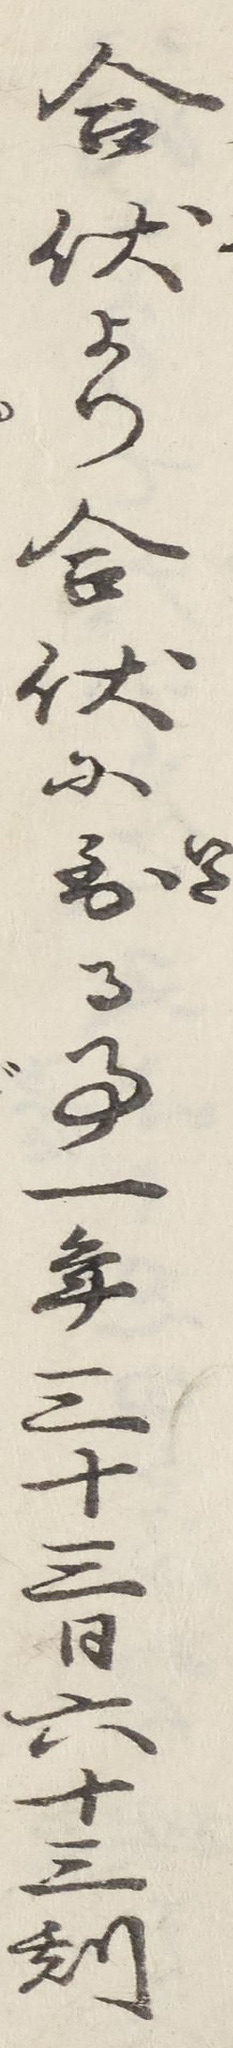合伏より合伏に至る事一年三十三日六十三刻
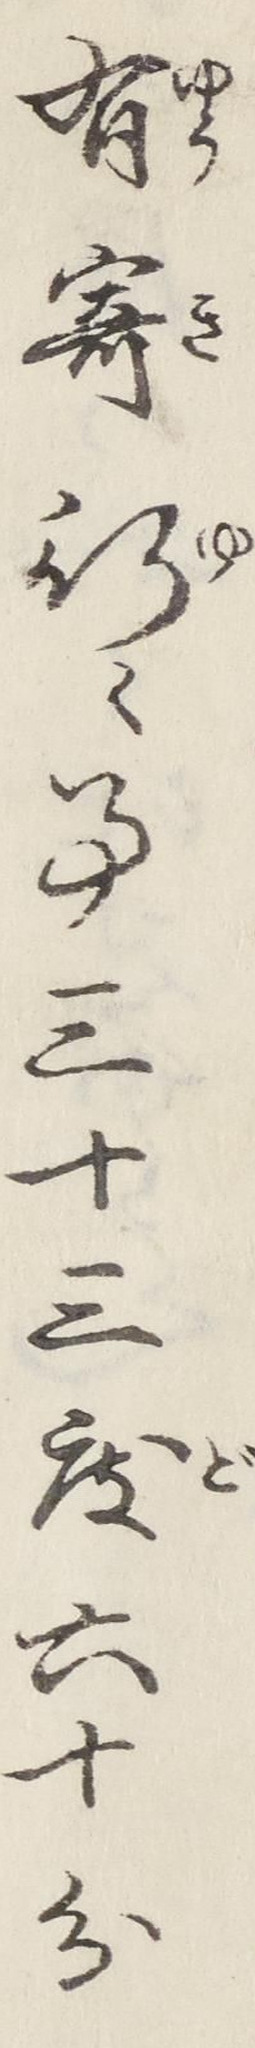有寄行く事三十三度六十分
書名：平天儀圖解
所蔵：東京大学地震研究所図書室 Earthquake Research Institute Library, The University of Tokyo, JAPAN
